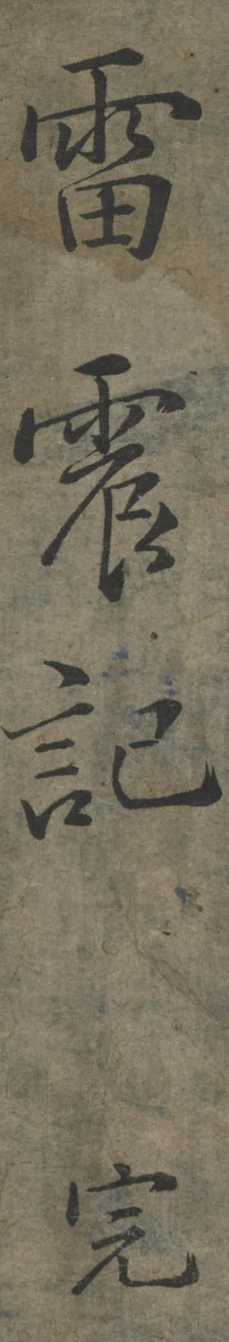雷震記完

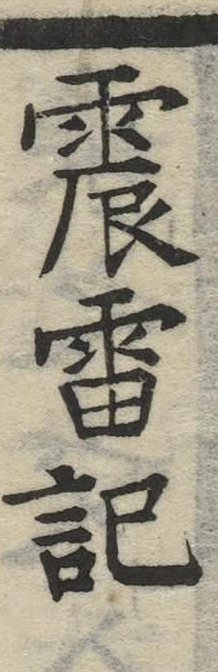震雷記
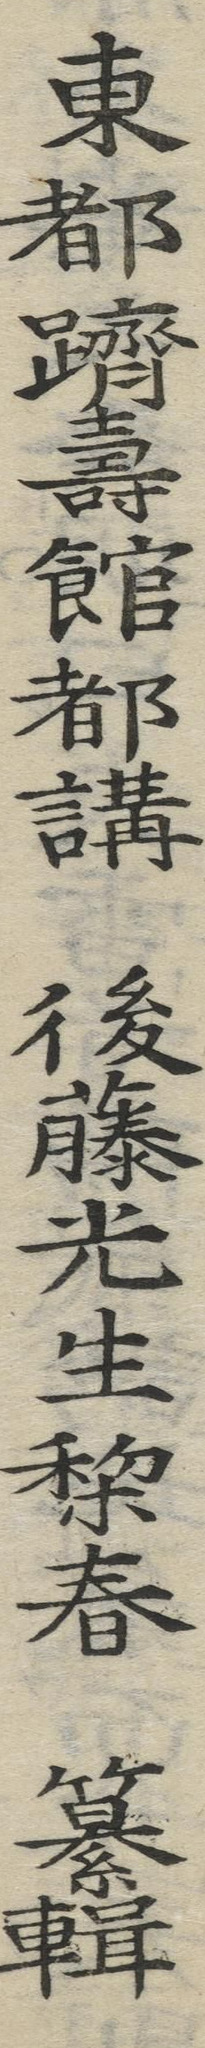東都躋壽館都講後藤先生黎春纂輯
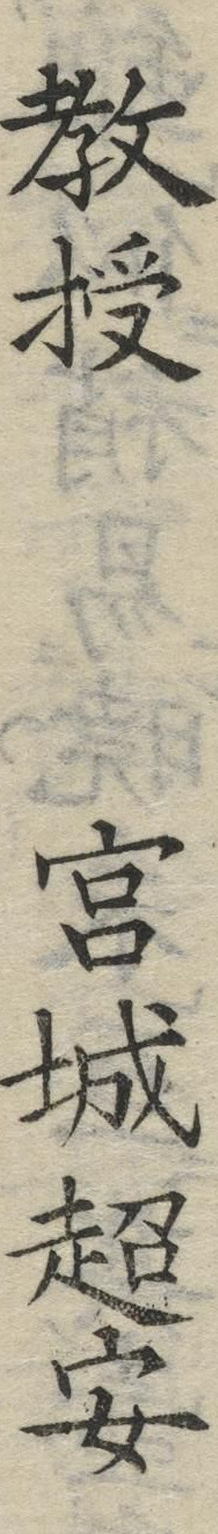教授宮城超安
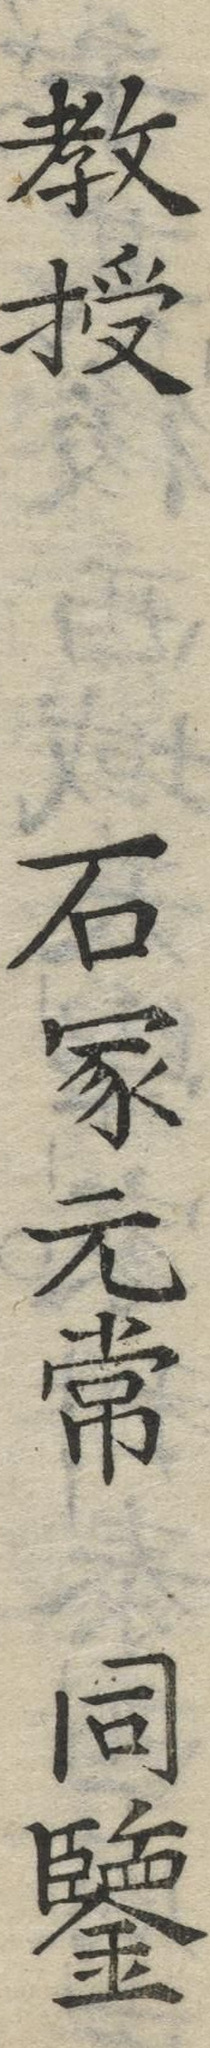教授石冢元常同鑒
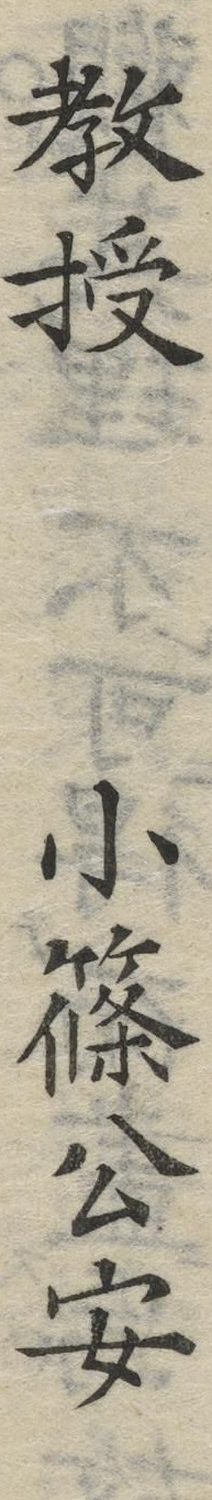教授小篠公安
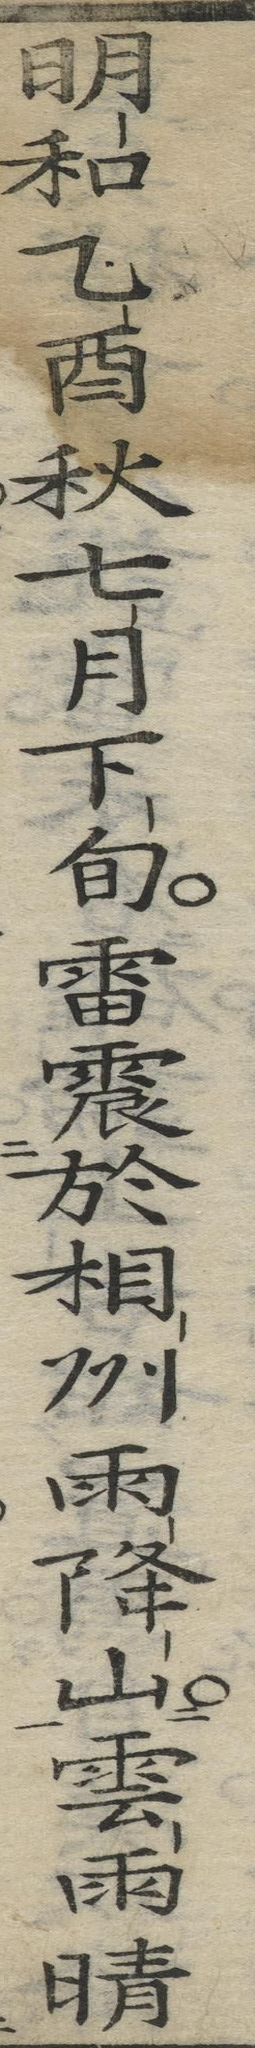明和乙酉秋七月下旬。雷震於相州雨降山。雲雨晴

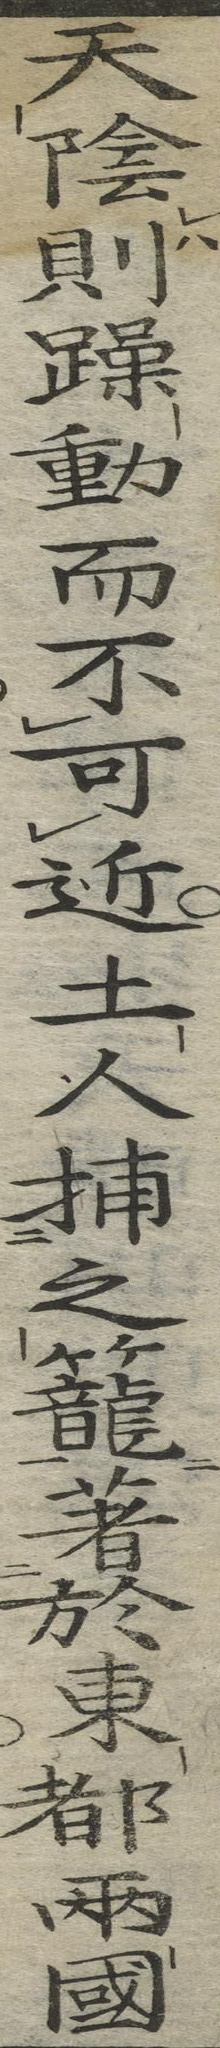天陰則躁動而不可近。土人捕之駕籠著於東都両国
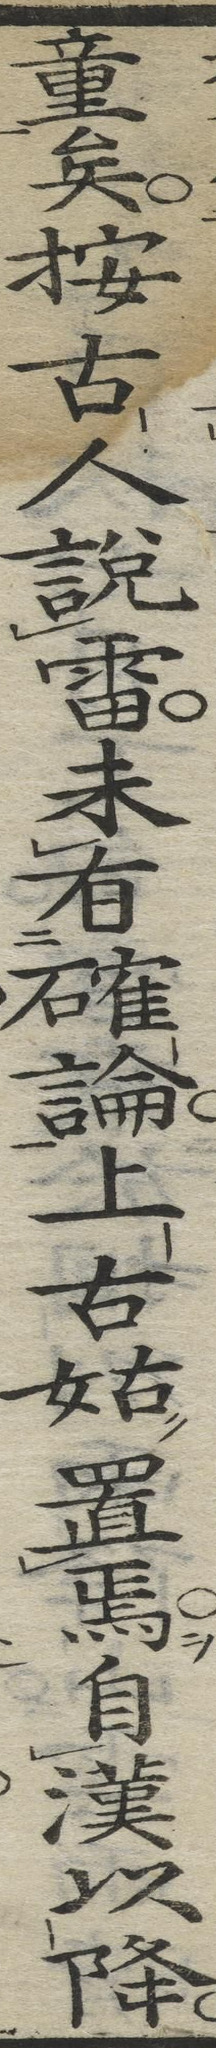童矣。按古人説雷。未有確論。上古姑置焉。自漢以降。
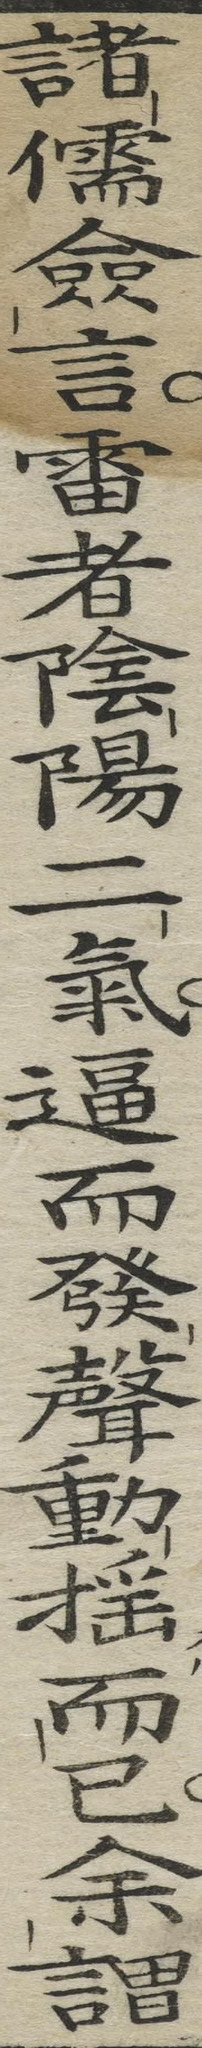諸儒僉言。雷者陰陽二氣。逼而發聲動揺而已。余謂
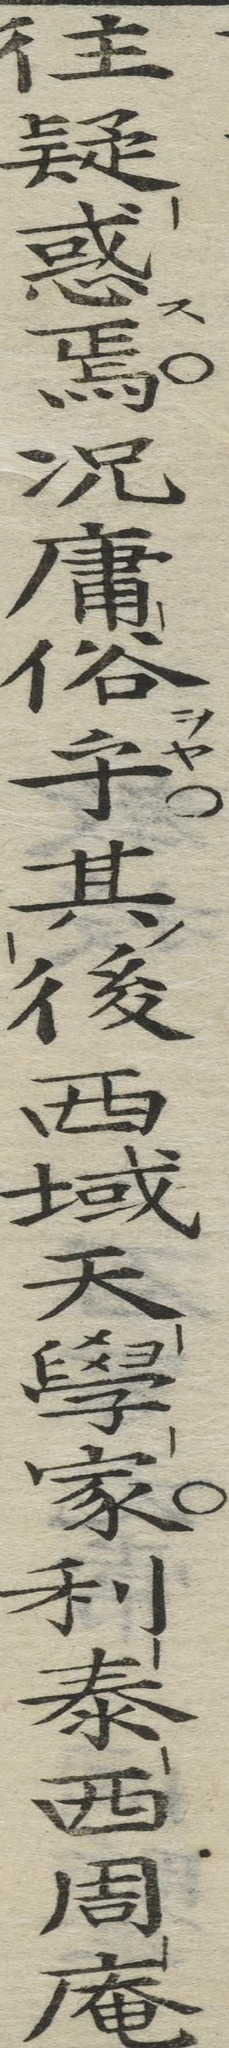往疑惑焉。況庸俗ヲヤ宇其後西域天学家利泰西周庵
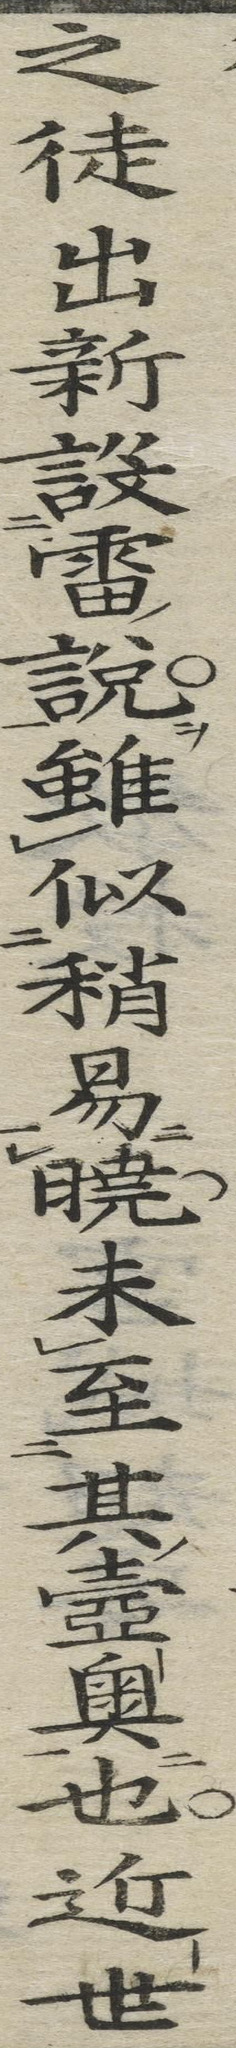之徒出新設説ヲ雖似稍易暁未至其壺奥也近世
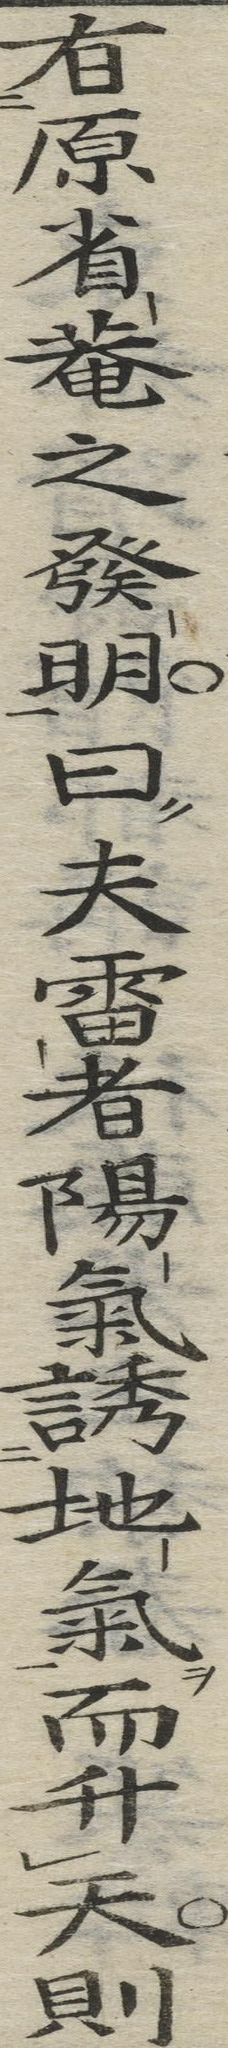有原省庵之発明曰ク夫レ雷者陽気誘地気而升天則
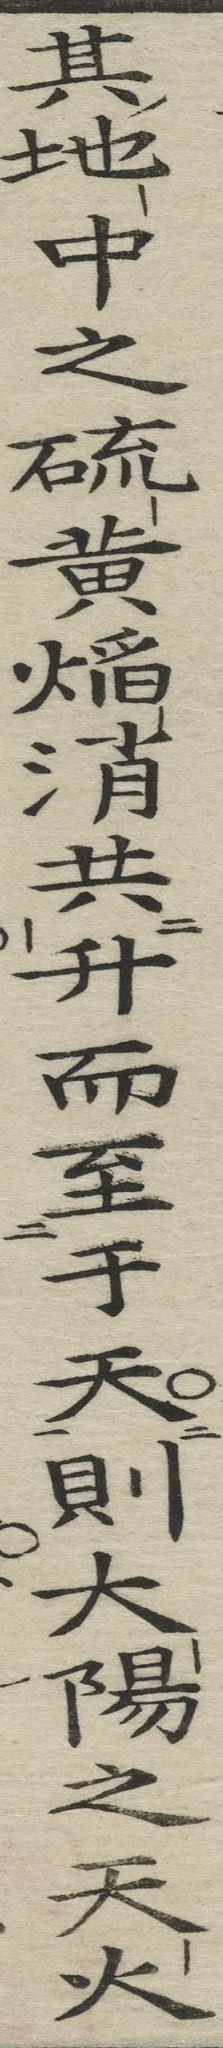其地中之硫黄焔硝共に升而至干天則太陽之天火
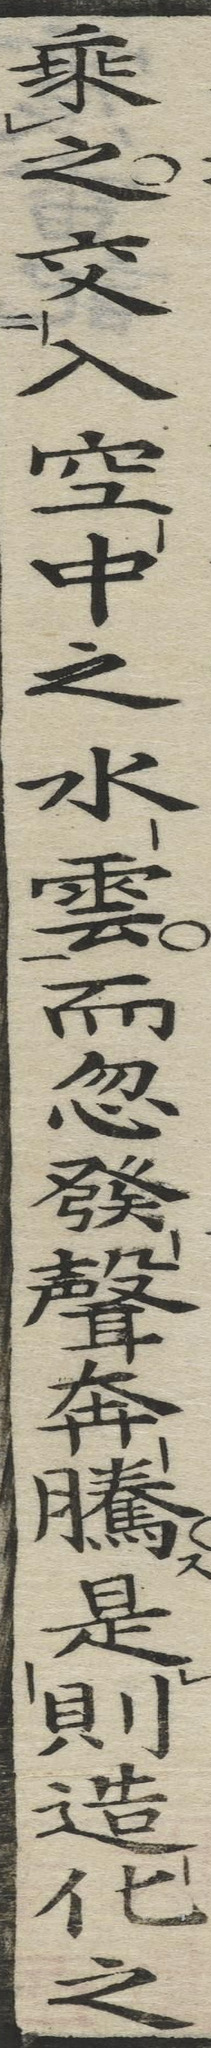乗之交入空中之水雲而忽発声奔騰ス是則造化之
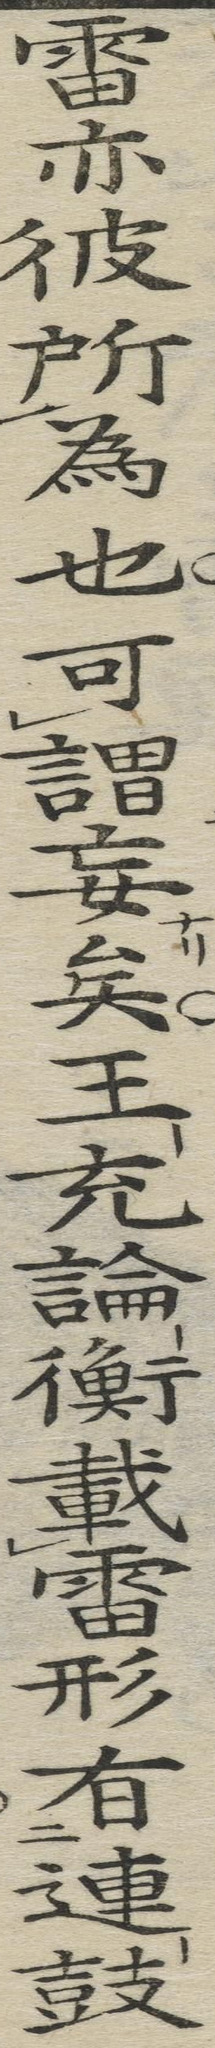雷亦彼所為也可謂妄ナリ矣王充論衡載雷形有連鼓
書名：雷震記　完
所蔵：東京大学地震研究所図書室 Earthquake Research Institute Library, The University of Tokyo, JAPAN
